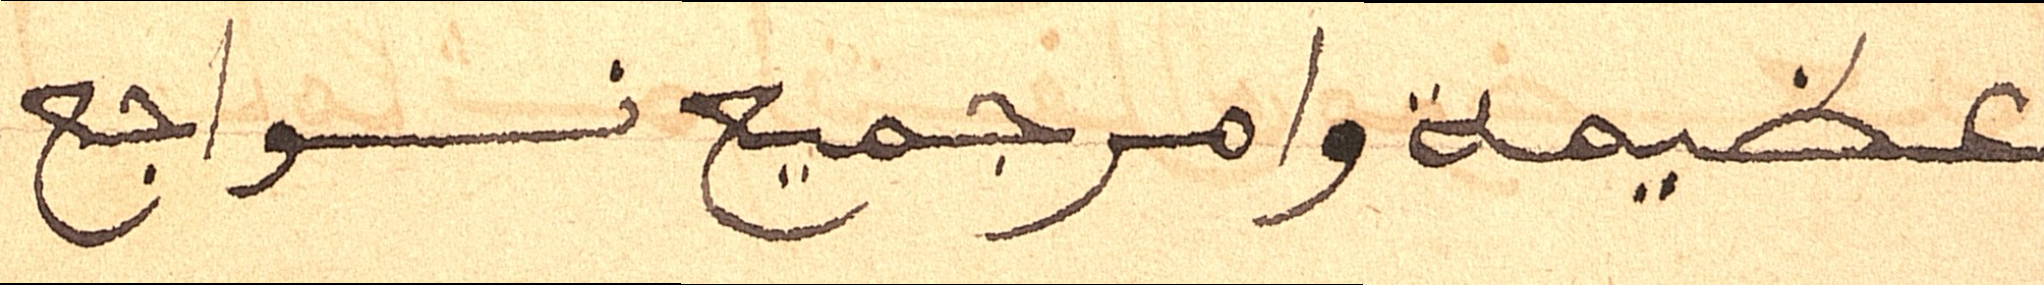عظيمة وامر جميع نواجع
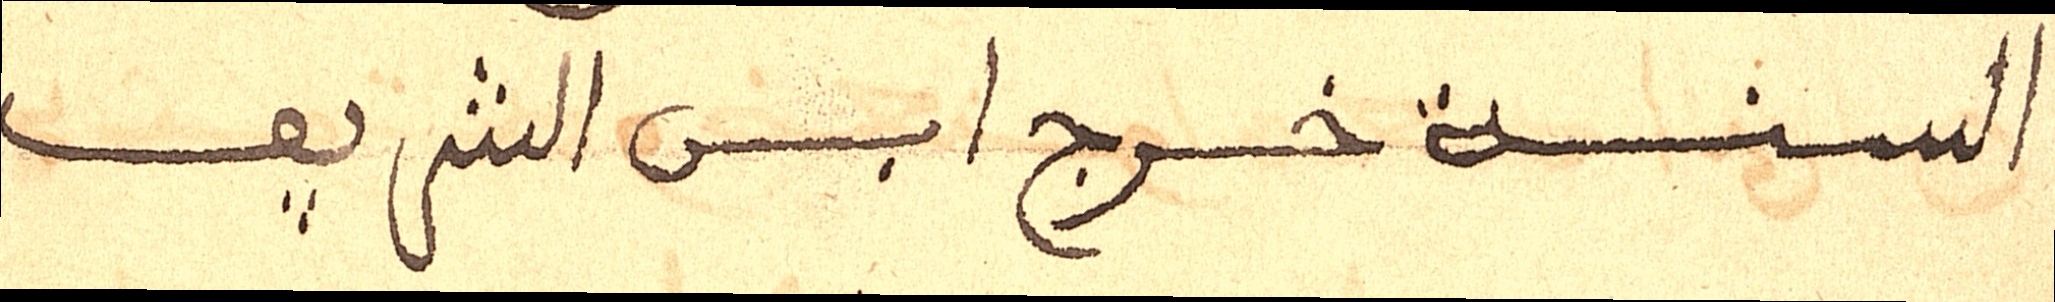السنة خرج ابن الشريف
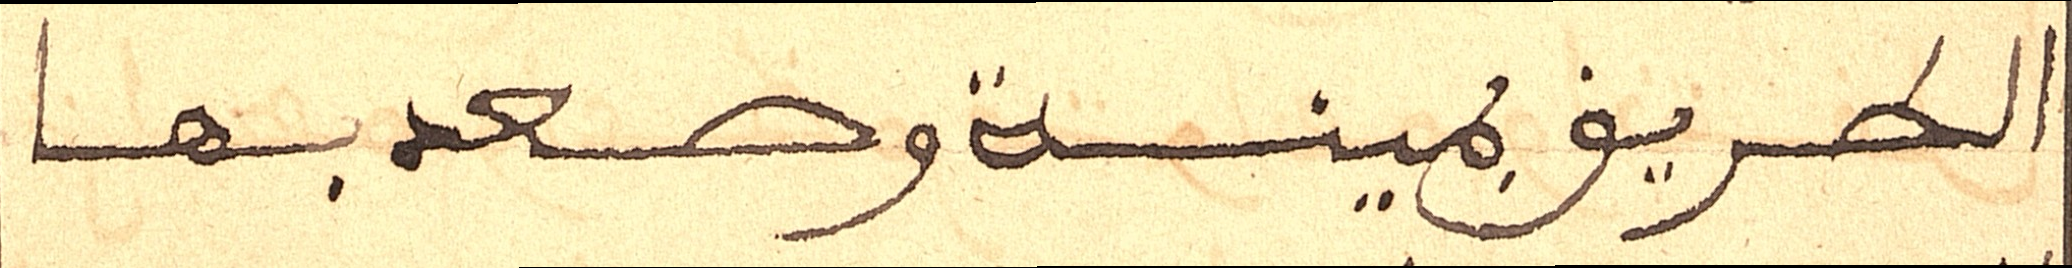الطريق بمينة وصعدبها
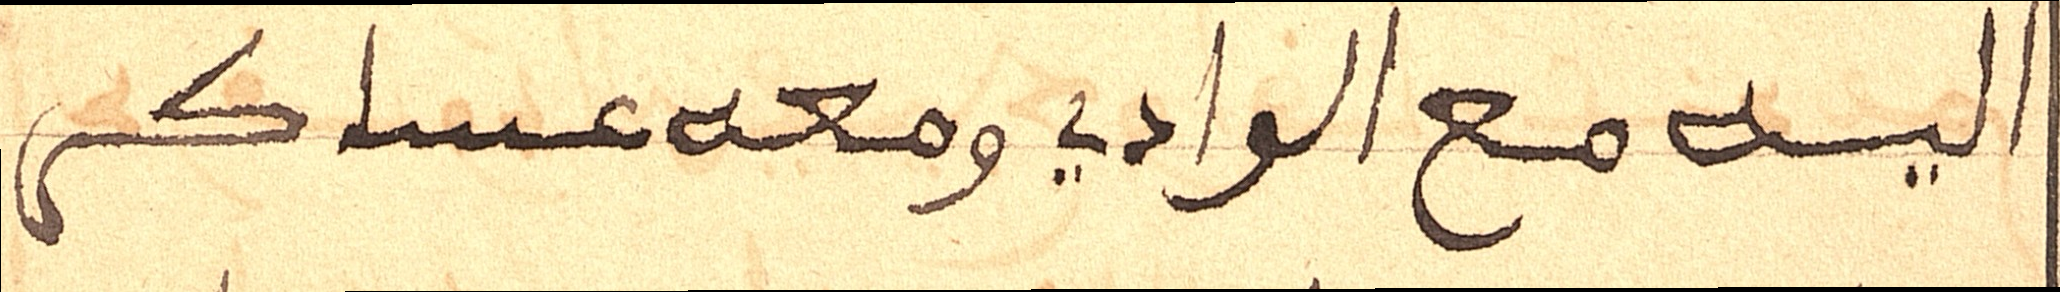اليه مع الوادي ومعه عساكر
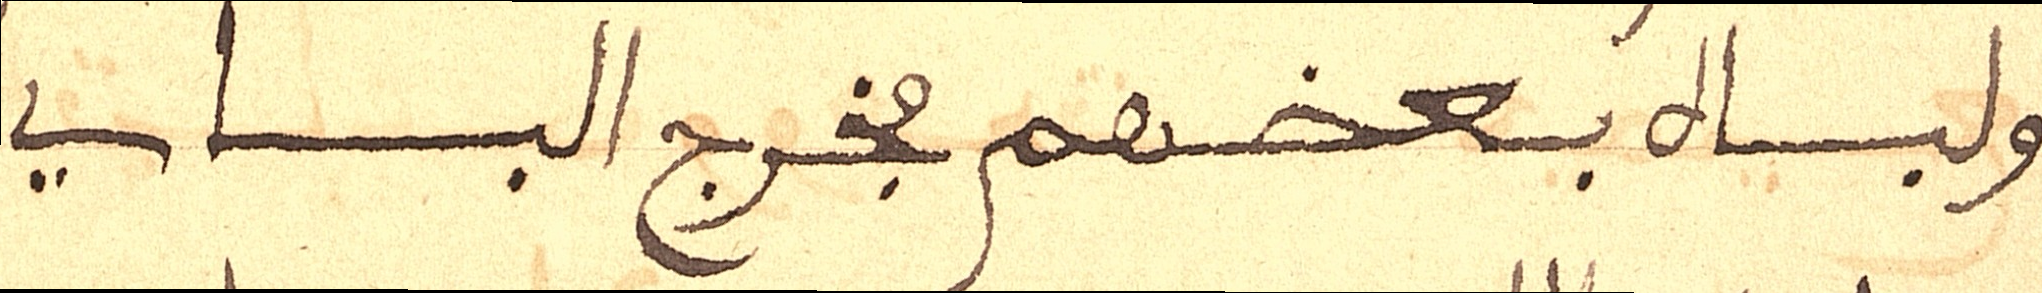ولباه بعضهم فخرج الباي
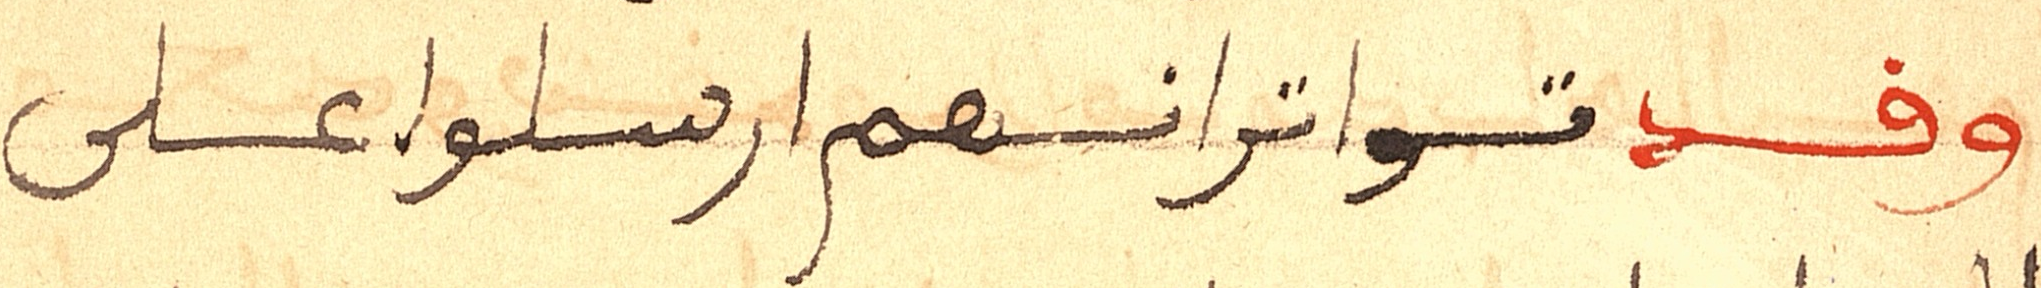وقد تواتر انهم ارسلوا على
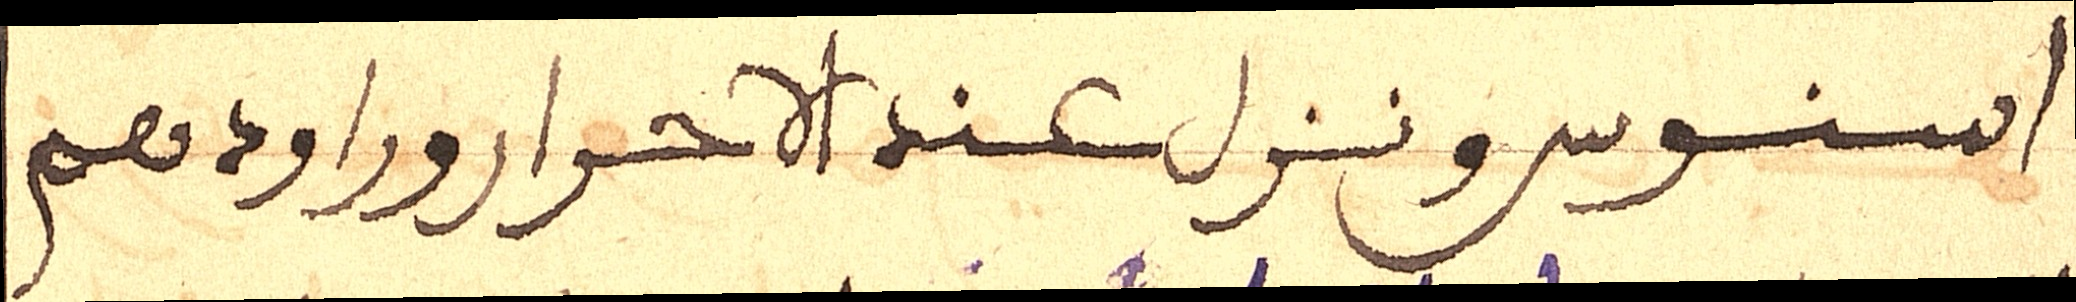اسنوس ونزل عنه الاحرار وراودهم
